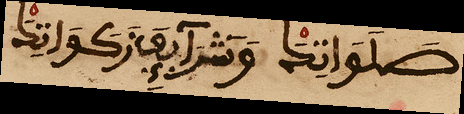صلواتك وشرآئف زكواتك
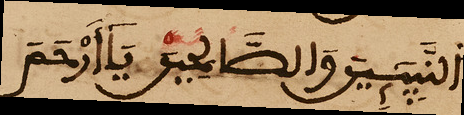النبيئين والصالحين يآ أرحم
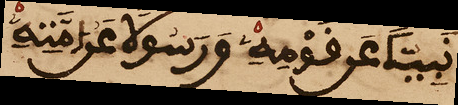نبيا عن قومه ورسولا عن امته
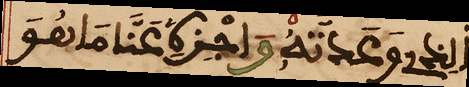الذي وعدته واجزه عنا ما هو
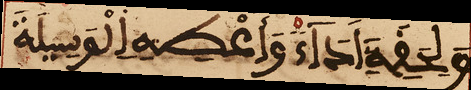ولحقه ادآء وأعطه الوسيلة
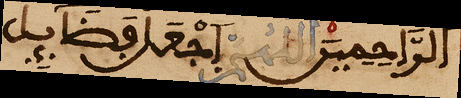الراحمين اللهم اجعل فضآئل
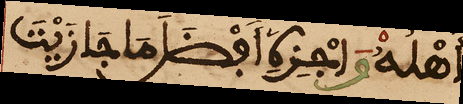أهله واجزه أفضل ما جازيت
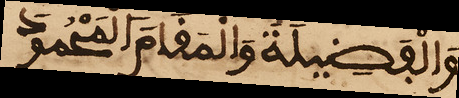والفضيلة والمقام المحمود
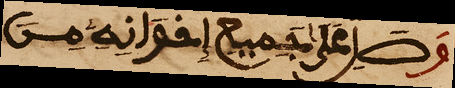وصل على جميع إخوانه من
